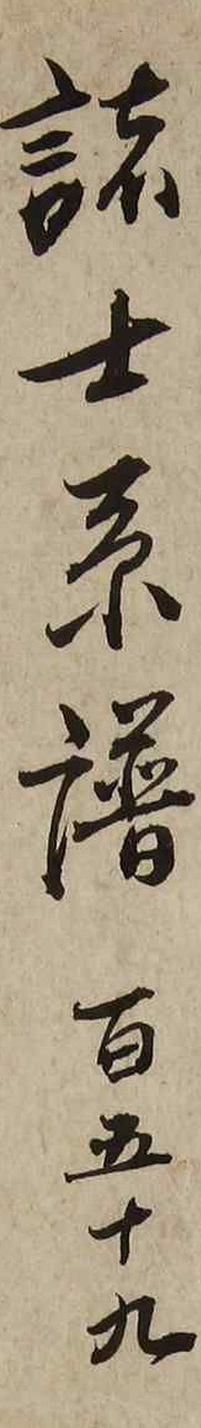諸士系譜百五十九

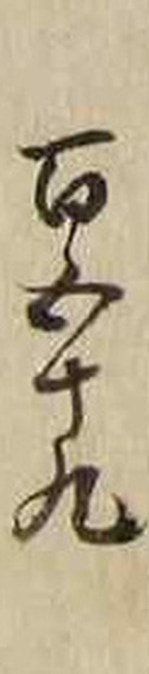百五十九

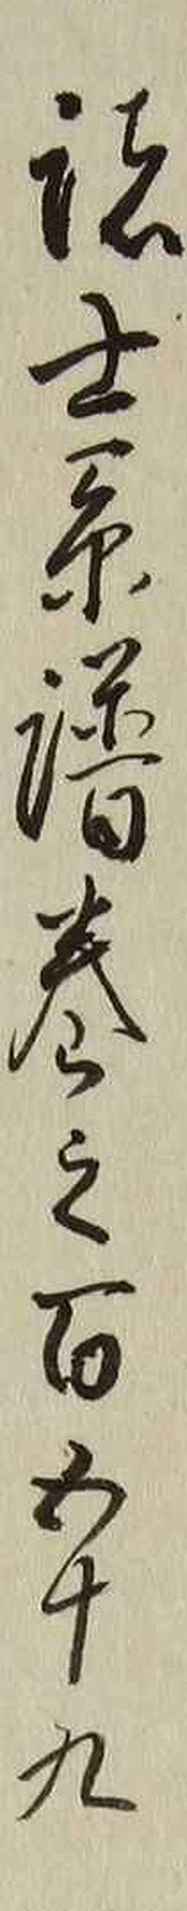諸士系譜巻之百五十九
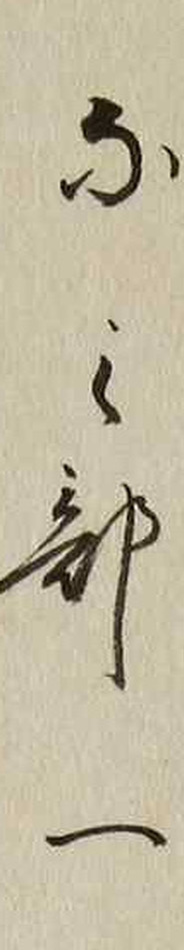な之部一
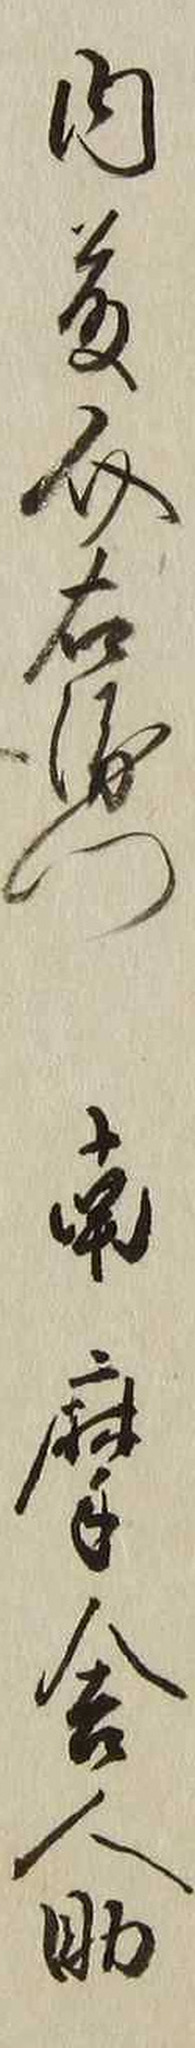内藤介右衛門南摩舎人助

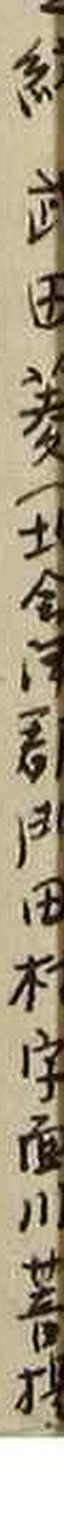定紋武田菱「北会津郡門田於字面川菩提
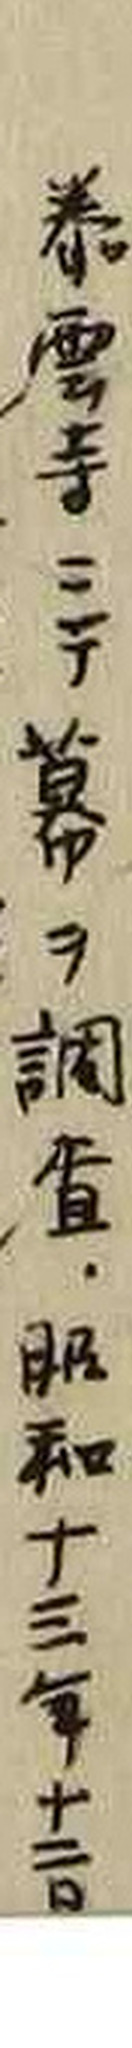泰雲寺にて幕を調査昭和十三年十二月
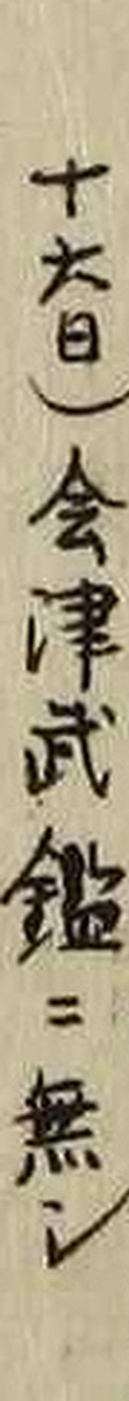十六日」会津武鑑に無シ
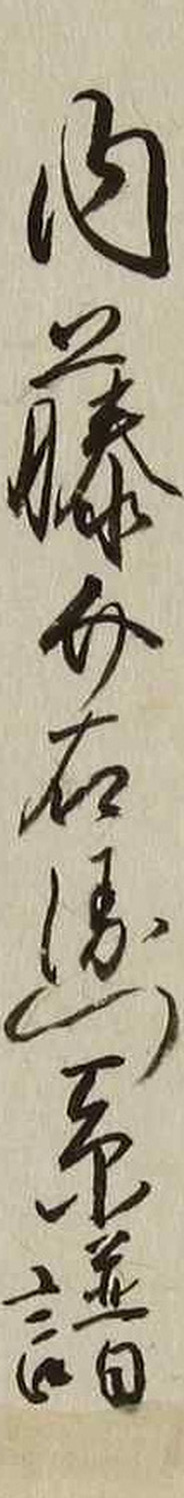内藤介右衛門系譜
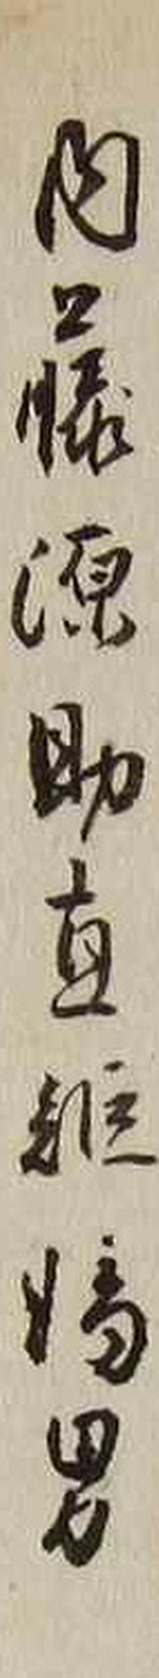内藤源助直矩嫡男
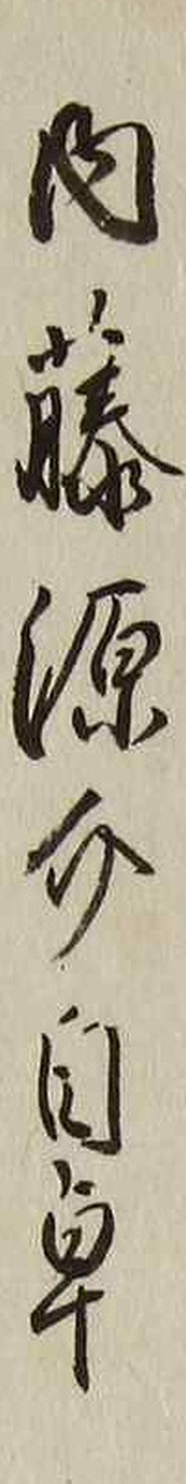内藤源介自卓
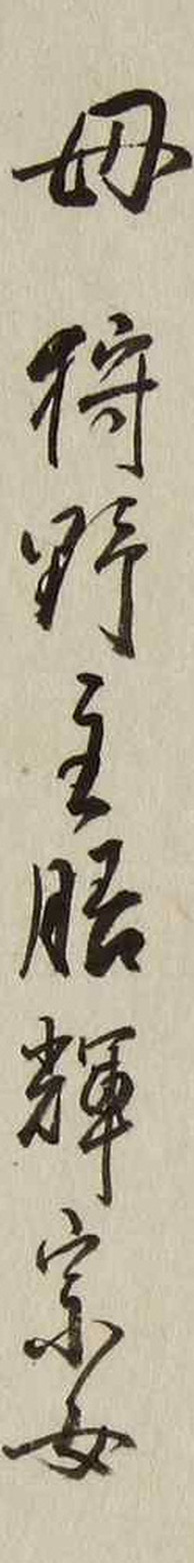母狩野主膳輝宗女
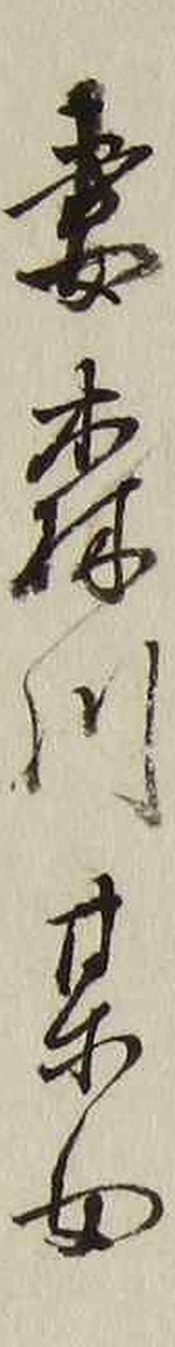妻森川某女
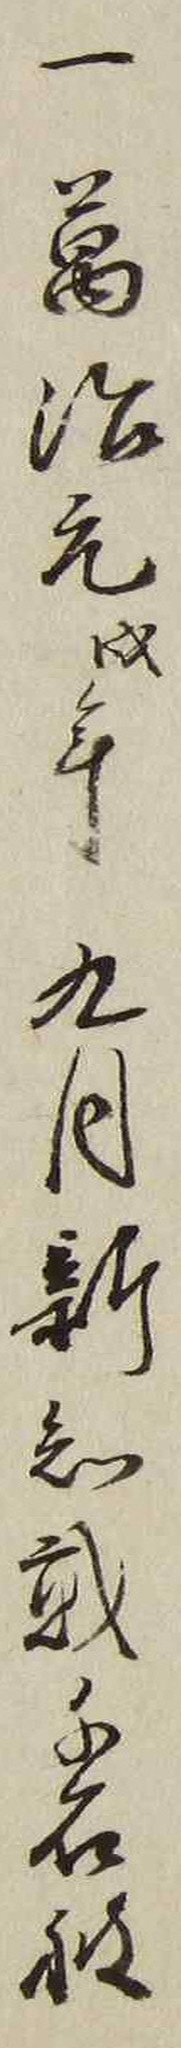一万治元戌年九月新知弐千石被

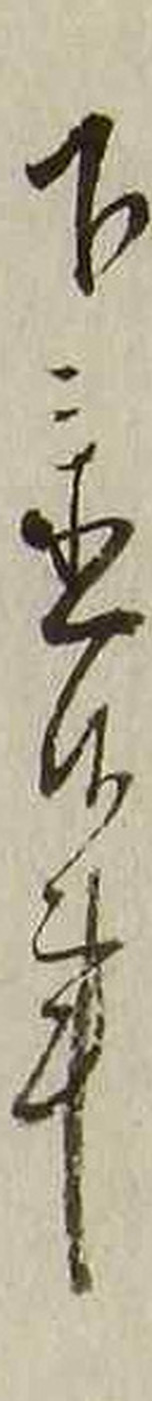下置候事
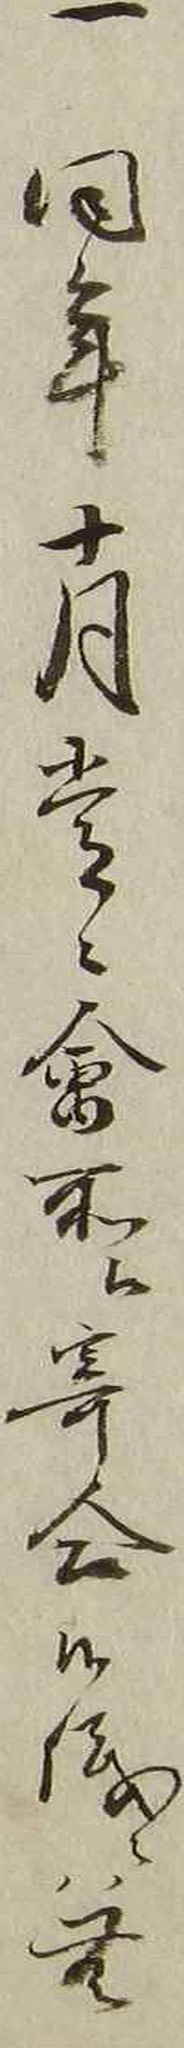一同年十月常々会所江寄合候儀には無
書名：諸士系譜　巻之159　な之部1
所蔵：会津若松市立会津図書館
